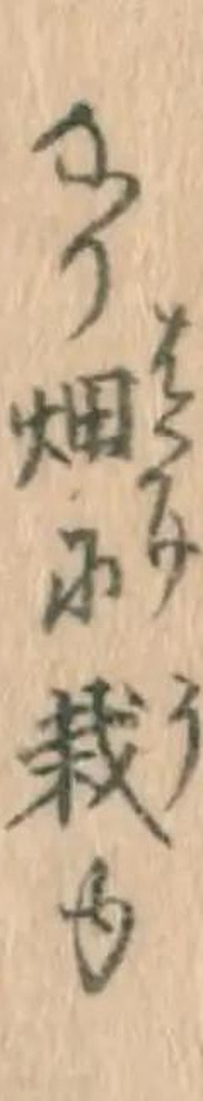なり畑に栽ゆ
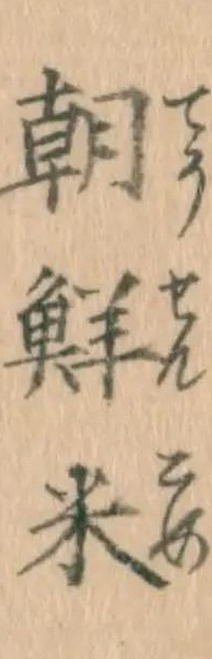朝鮮米

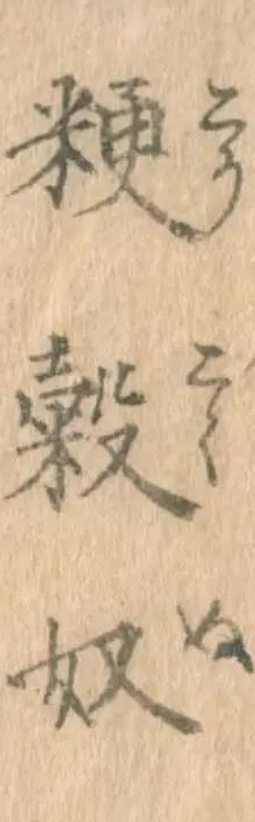粳穀奴
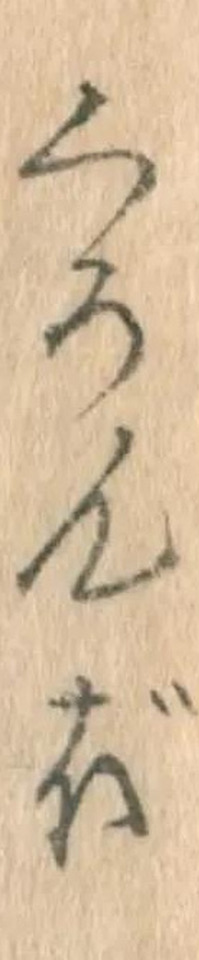くろんぼ
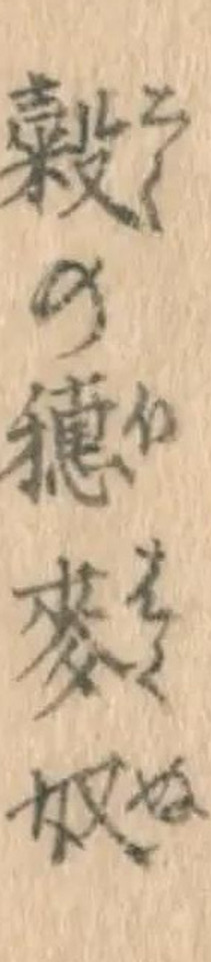穀の穂麦奴
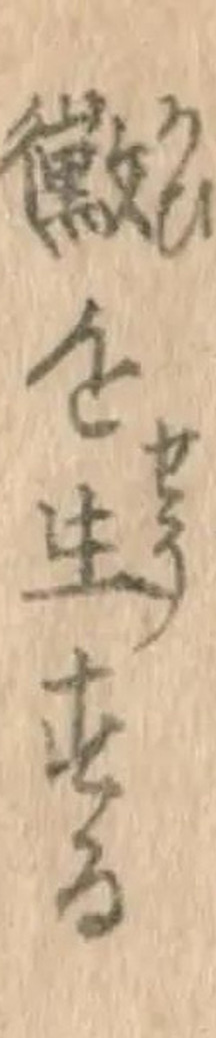黴を生する
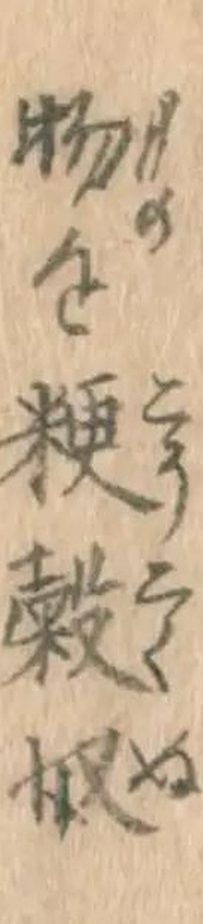物を粳穀奴
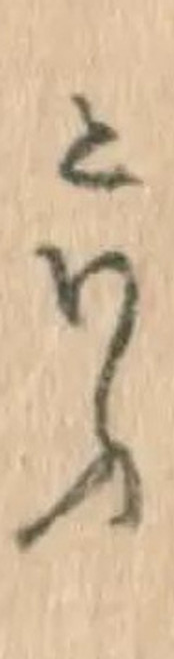といふ

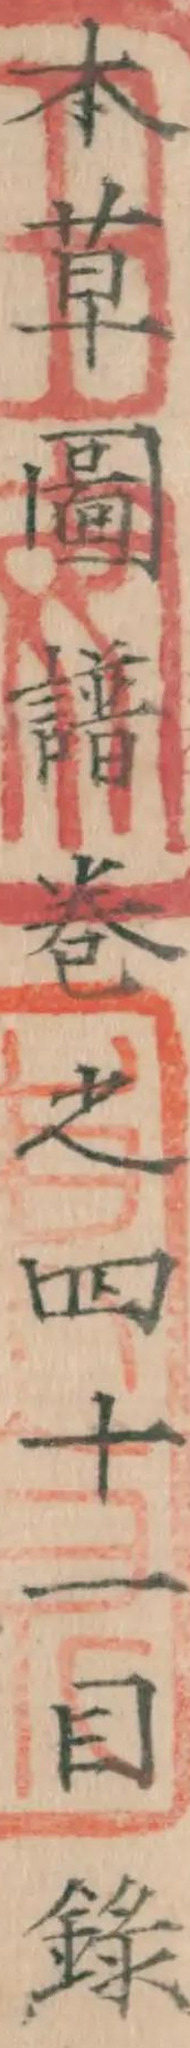本草図譜巻之四十一目録

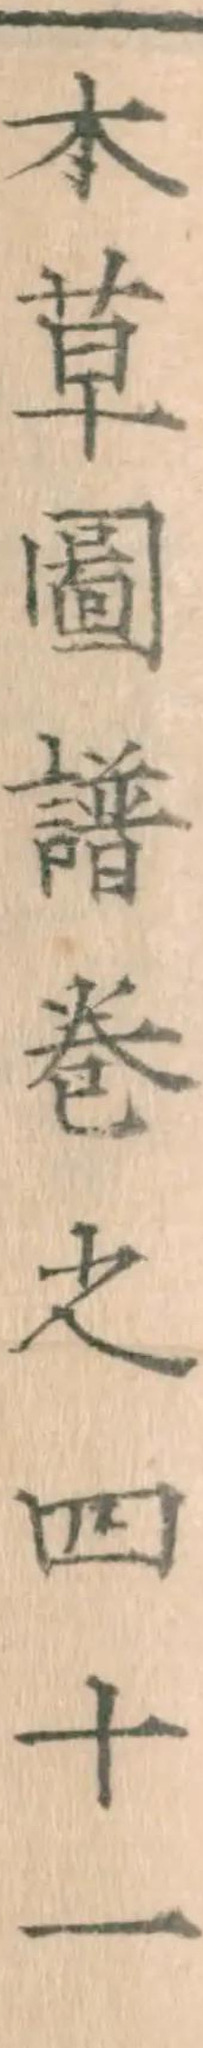本草図譜巻之四十一
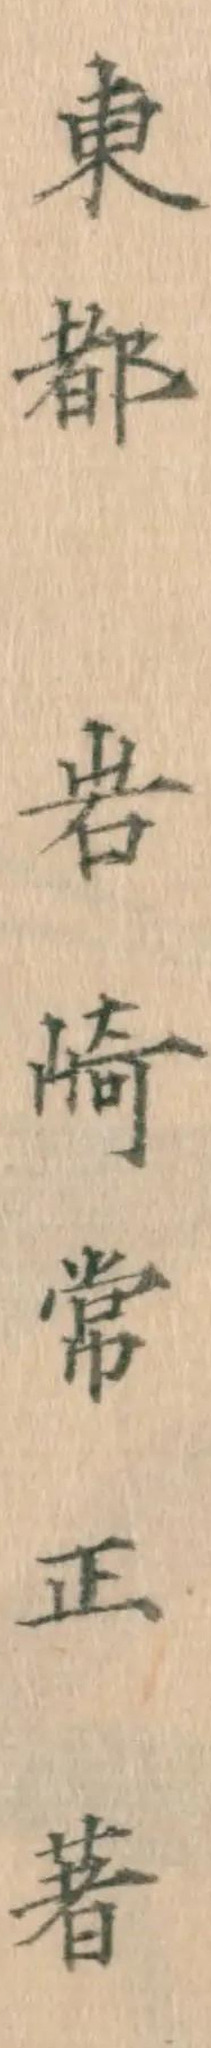東都岩崎常正著
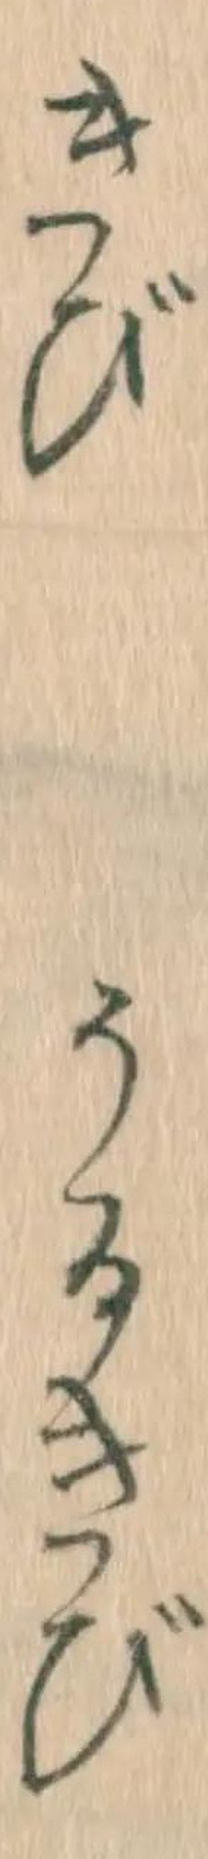稷きびうるきび
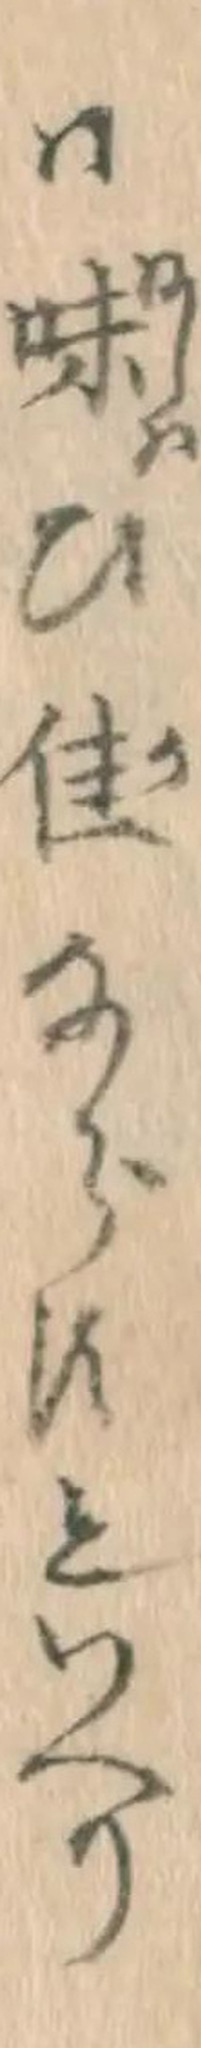は味ひ佳ならすといへり
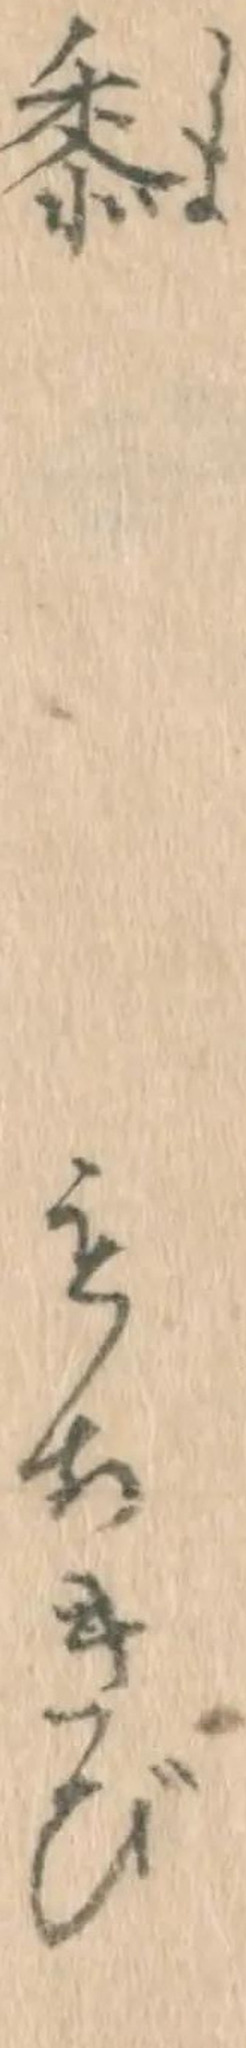黍もちきび
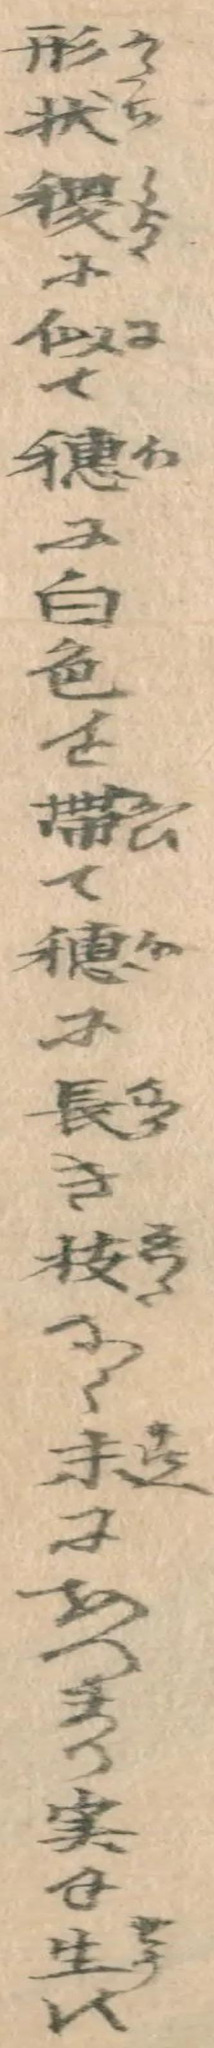形状稷に似て穂に白色を帯て穂に長き枝なく末にあつまり実を生す

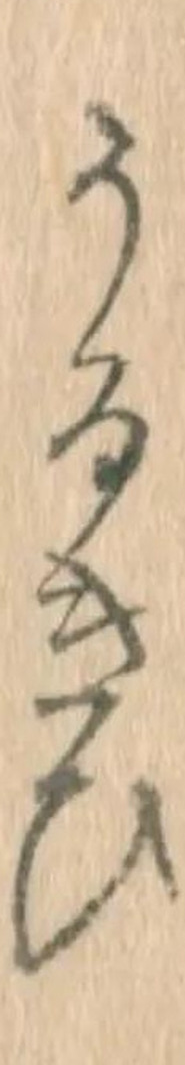うるきひ
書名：本草図譜. 巻40-42
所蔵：国立国会図書館 National Diet Library, JAPAN
